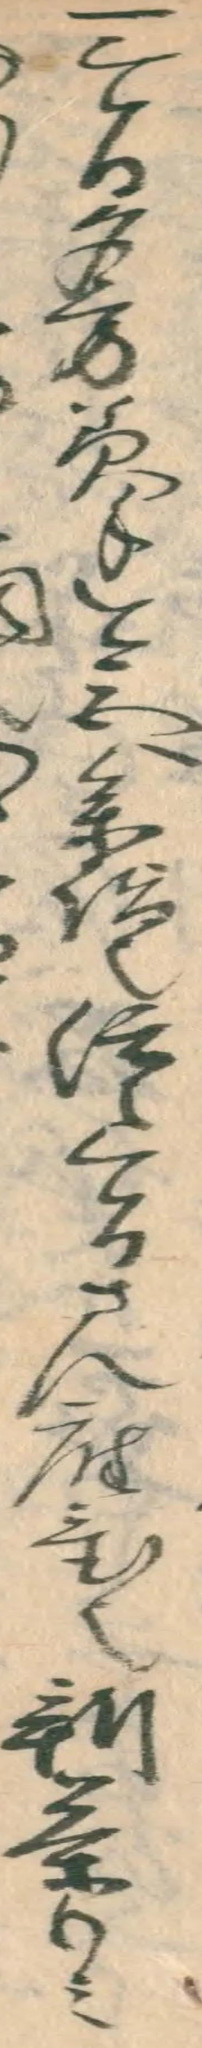一今日夕方美手今宮へ参詣也依之今日さん雇置也新茶もミ
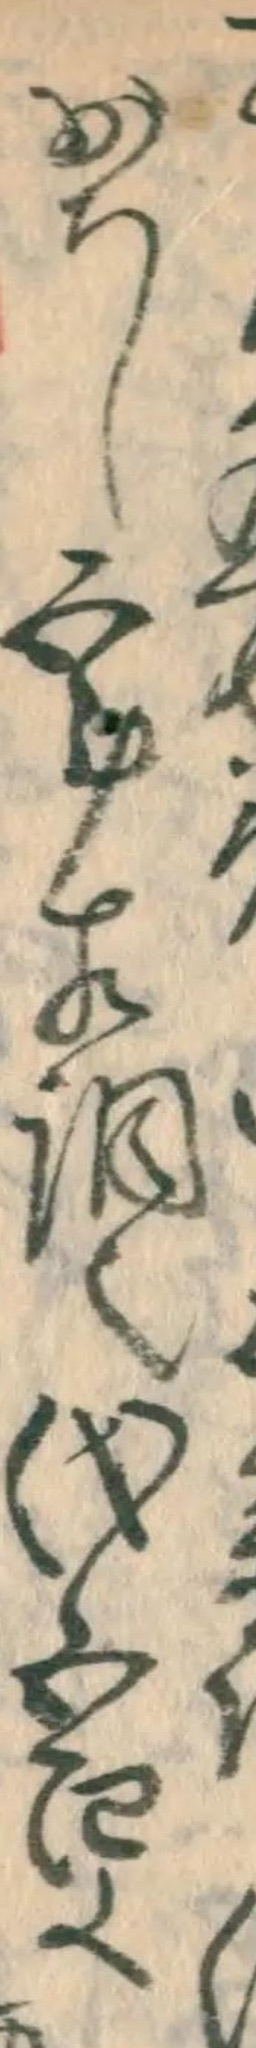おろし五斗相調也代五百文
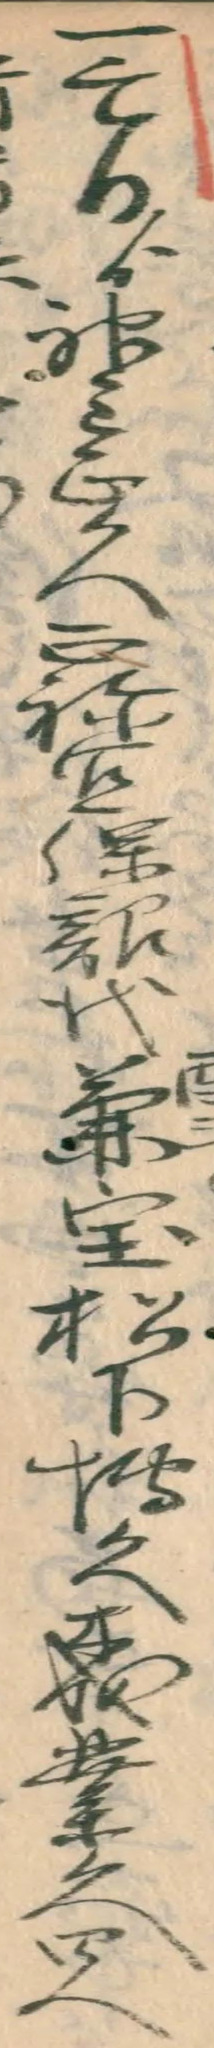一今日ゟ神主正久正祢宜保韶代酉三郎兼宝松下博久森業久四人
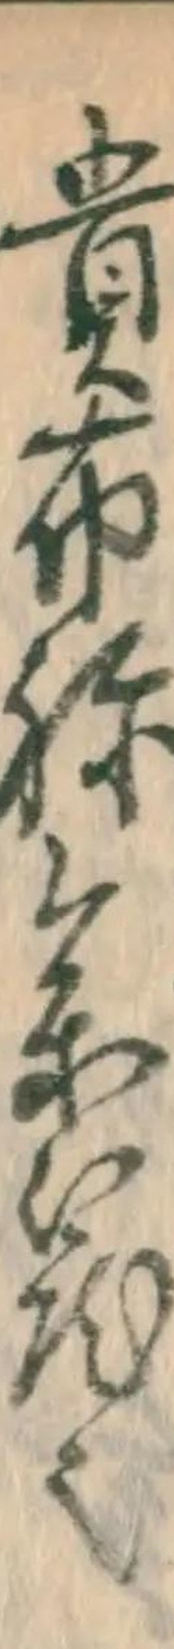貴布祢参籠也
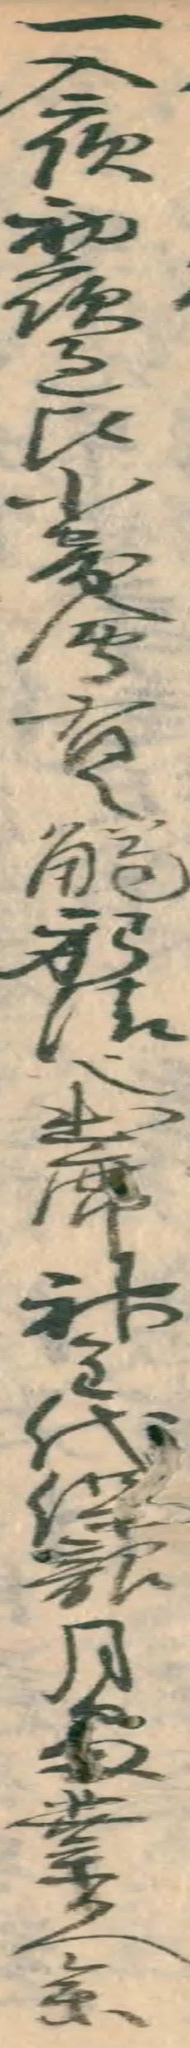一入夜初夜過比小寄会有之触躬清也出席神主代保韶月番業久参
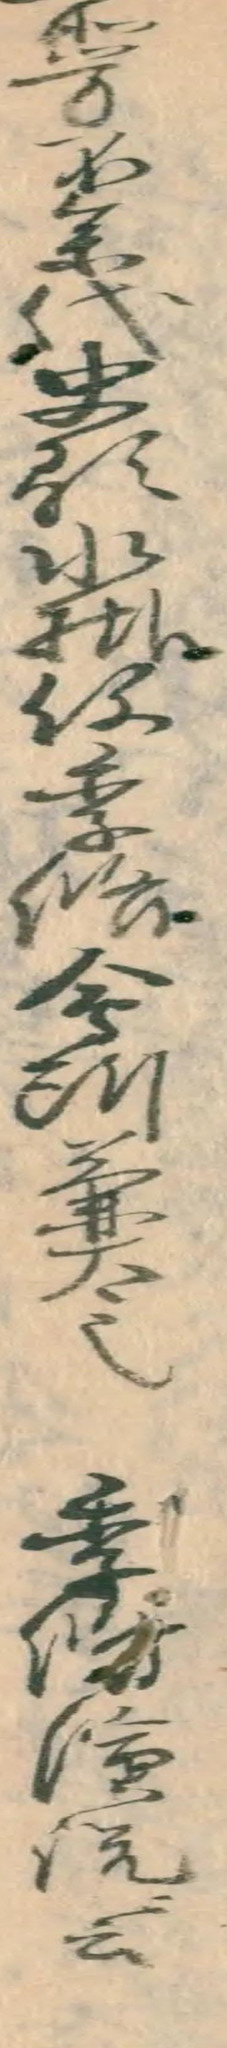所労不参代史顕水掛役季脩会所兼太也季脩演説ニ云
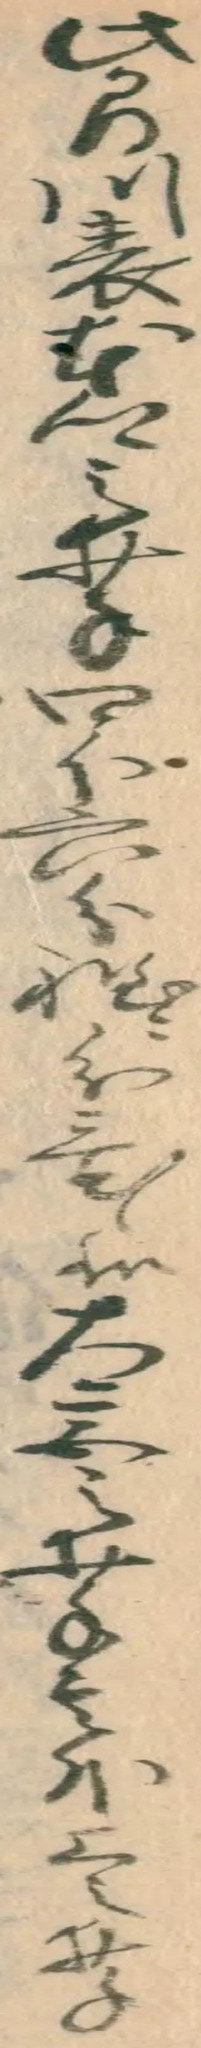此間川表本郷之井手四分六分程ニ分置候処大宮之井手其外上之井手
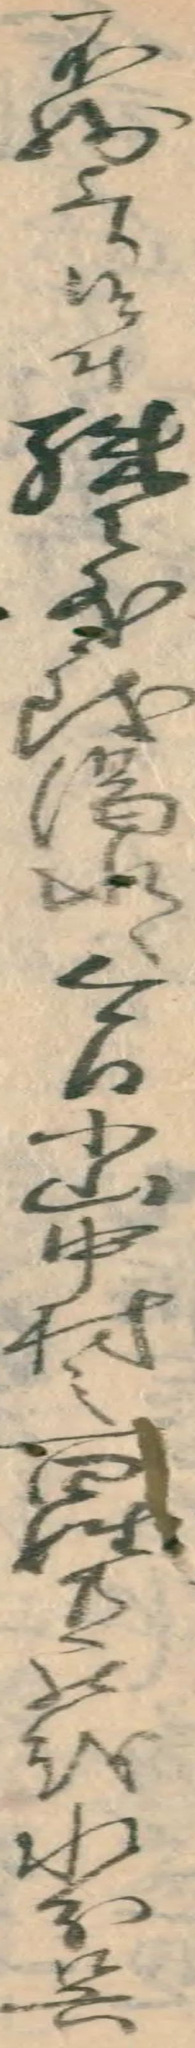不残上り候ニ付殊之外致渇水候今日小山中村之百姓共罷越水分呉
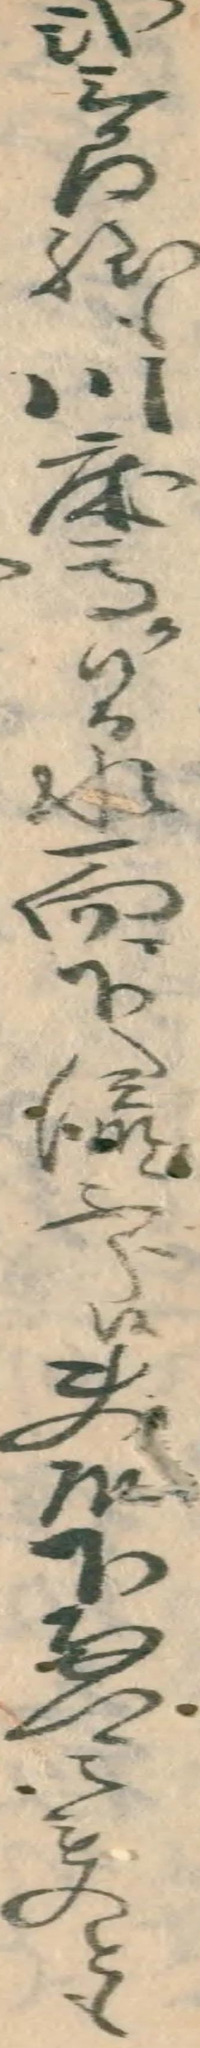弐三間程も川床高ク候而水一向ニ下へ流不申候夫故下両郷之ものとも
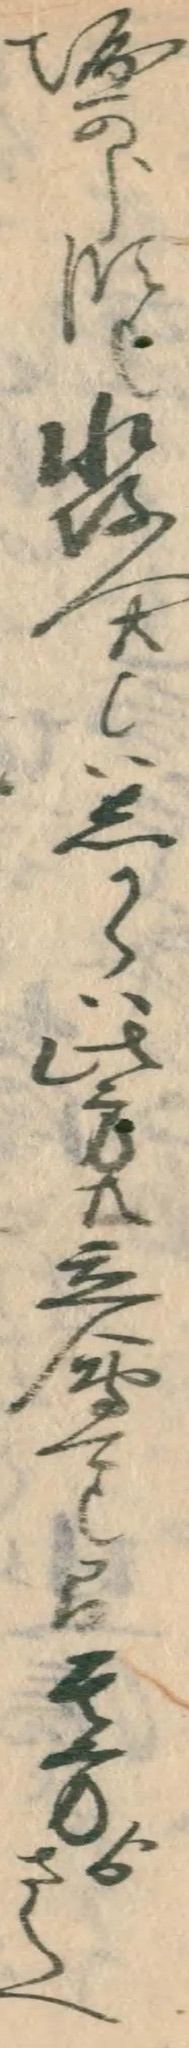堀可申段申候水役人共申候ハしからハ此方共立会可申候間其方ゟさらへ
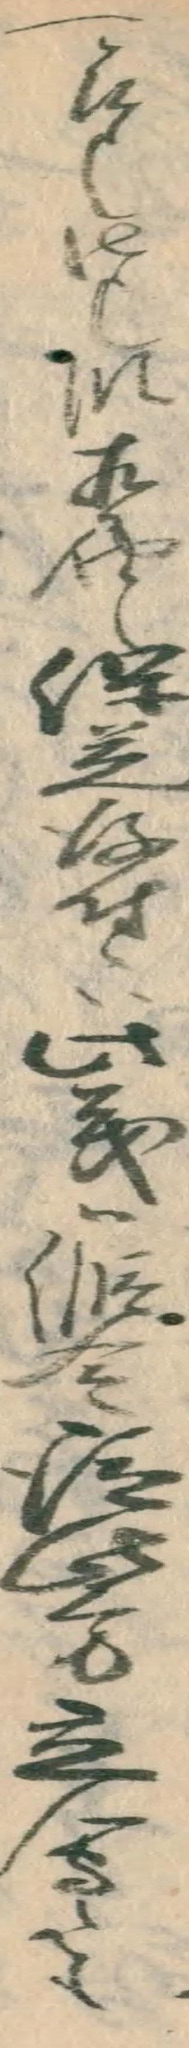可被申候由申段相届候保覚存付候ハ此義ハ仮令従此方立会候ても
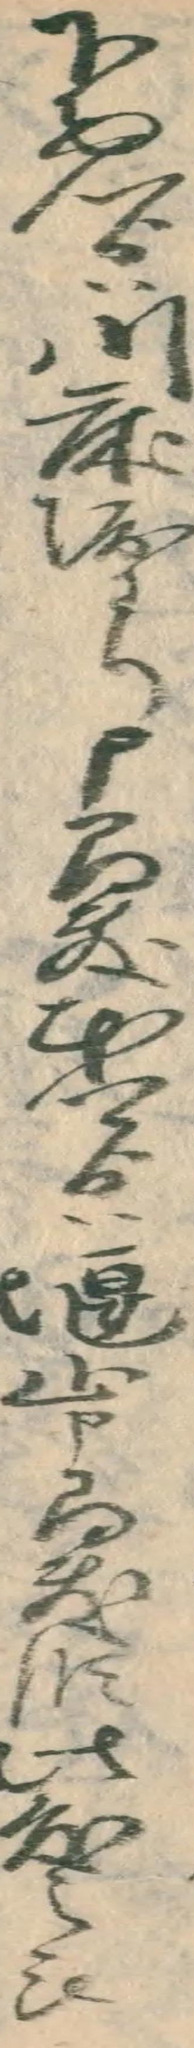下両郷ゟハ川床堀わり申間敷本郷ゟハ堰止申間敷段此度之被
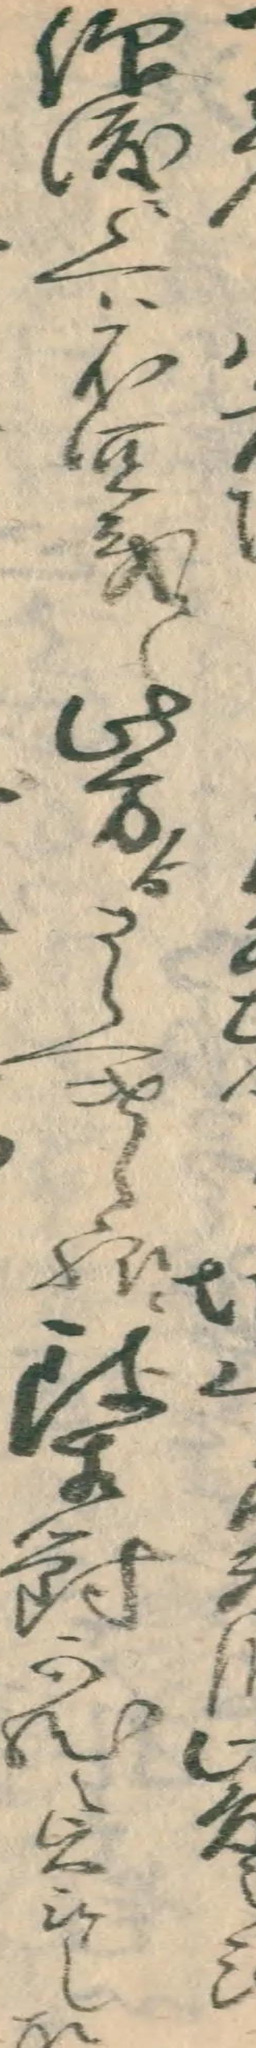仰渡ニ候へハ不宜義ニ候此方ゟさらへ遣し候様ニ致相対可然之旨被申候故
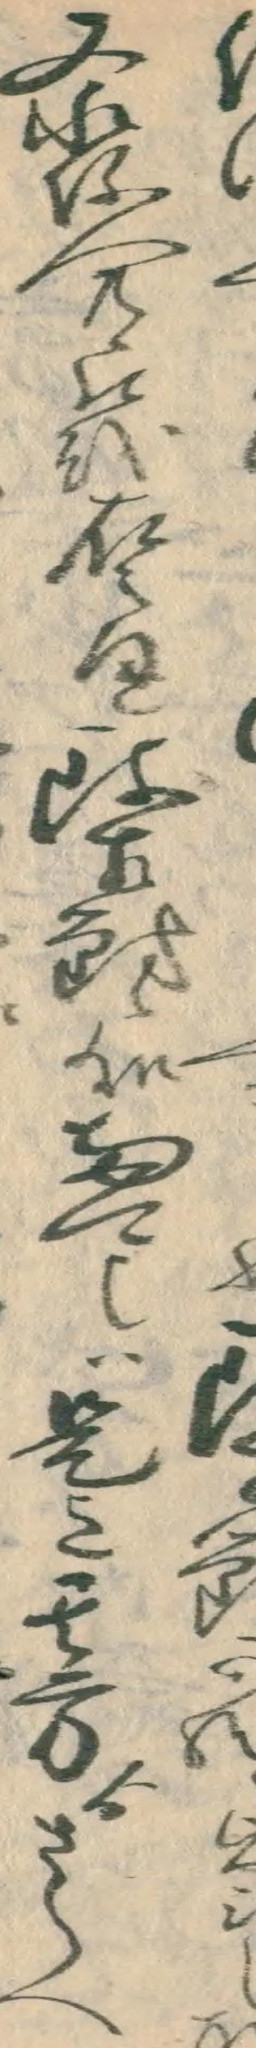又水役人共罷越右之通致相対候処両郷申候ハ是迄其方ゟさらへ
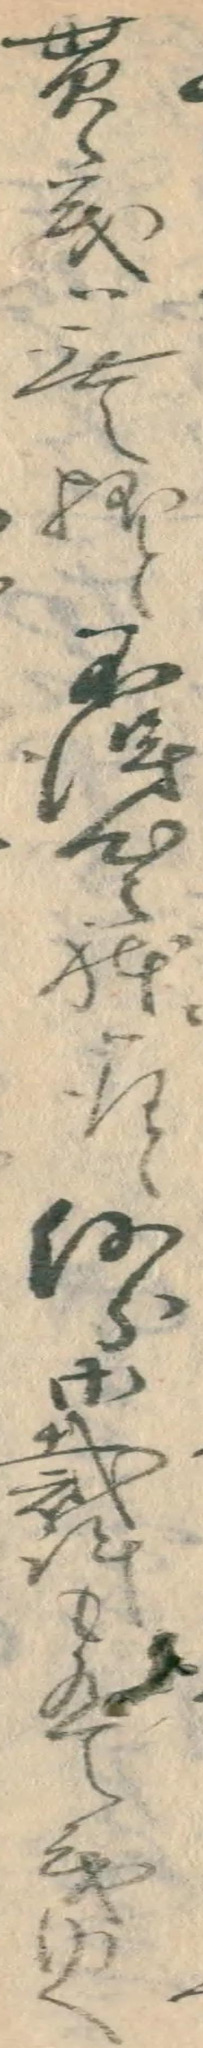貰候義ハ無之抔と不得心之体ニ御座候何分御裁許も有之義ゆへ
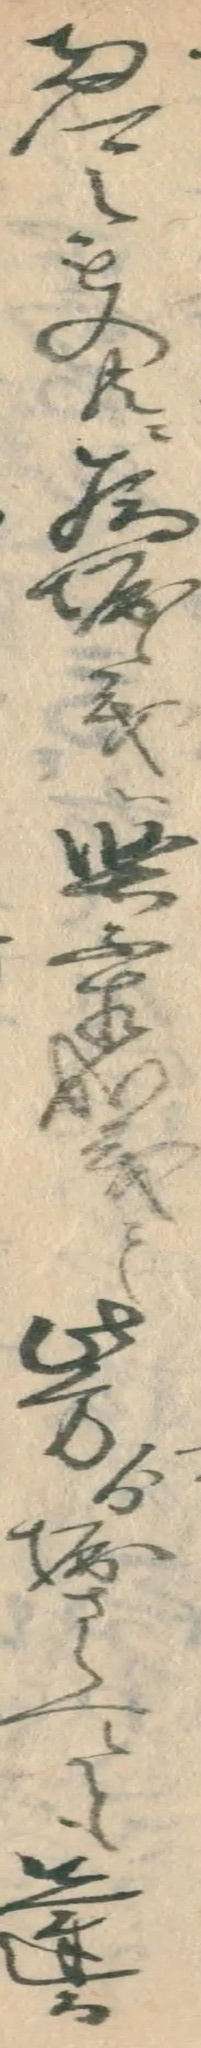両郷之もの共ニ為堀候義ハ堅不相成義ニ候此方ゟ掘さらへ候ても先達而
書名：賀茂社記録. 第58冊
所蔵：国立国会図書館 National Diet Library, JAPAN
